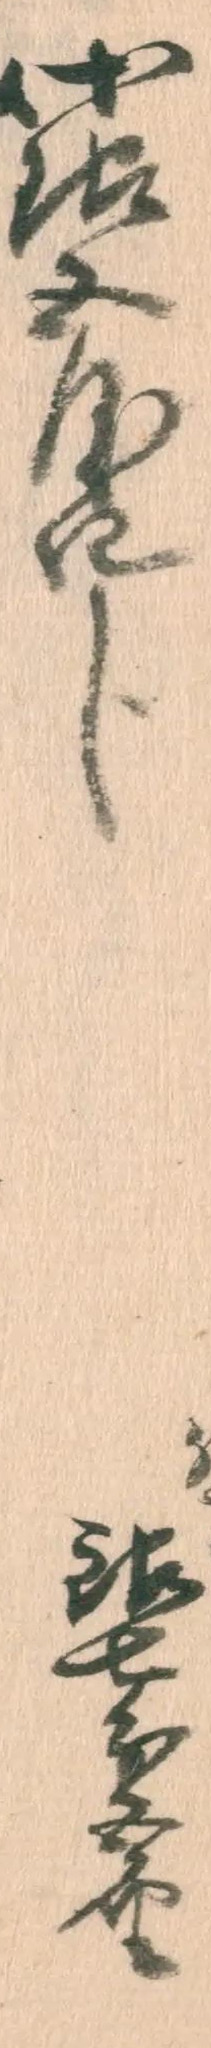代銀五匁四分銀七分五厘
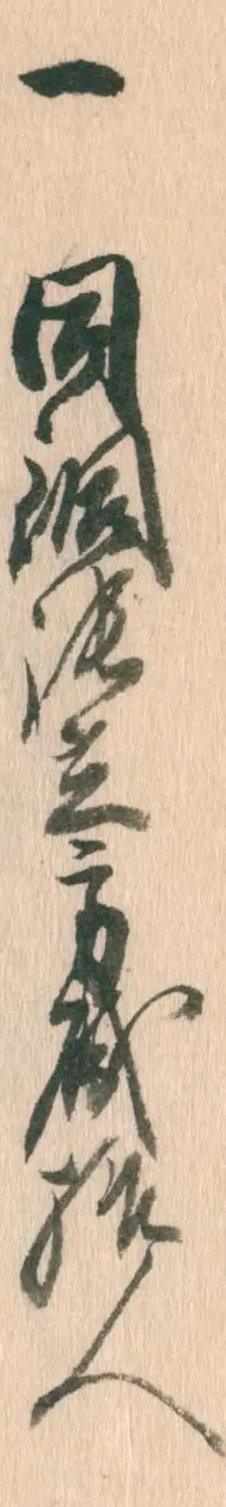一同銅張立方職拾人
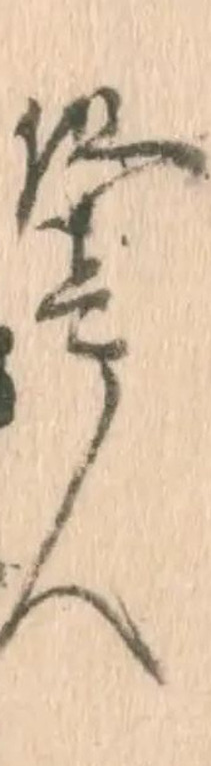但壱人
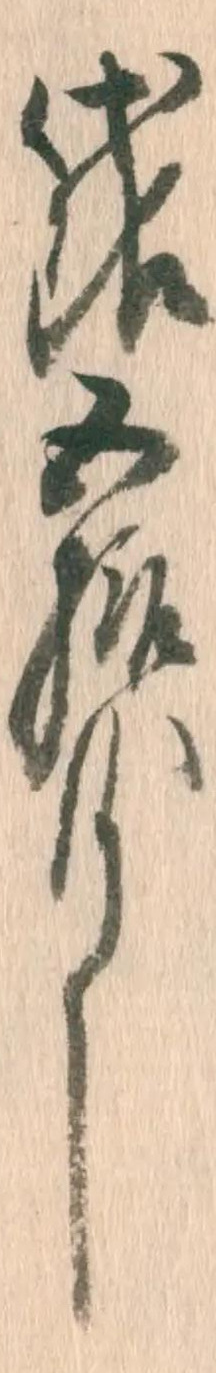代銀五拾匁銀五匁

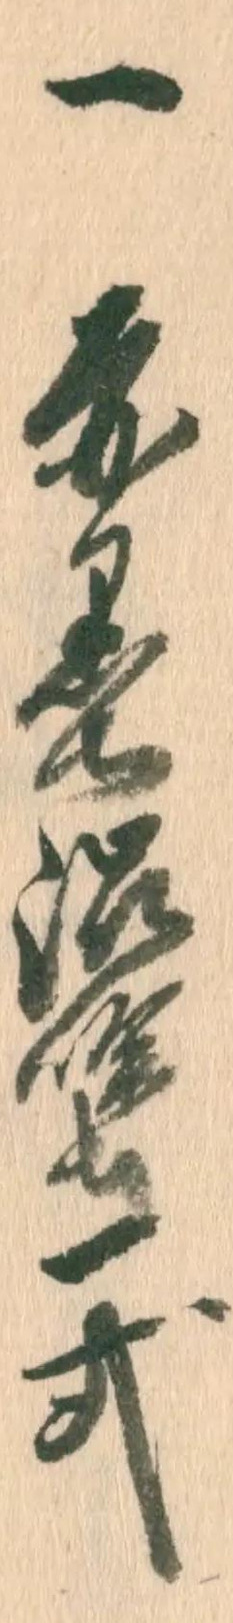一赤墨渋塗一式
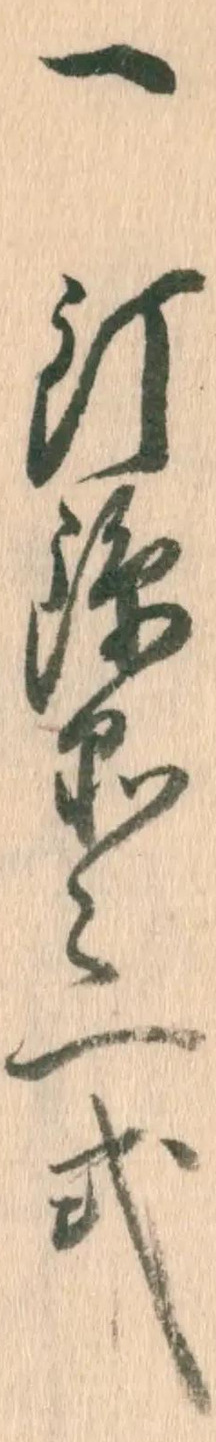一釘銯品々一式
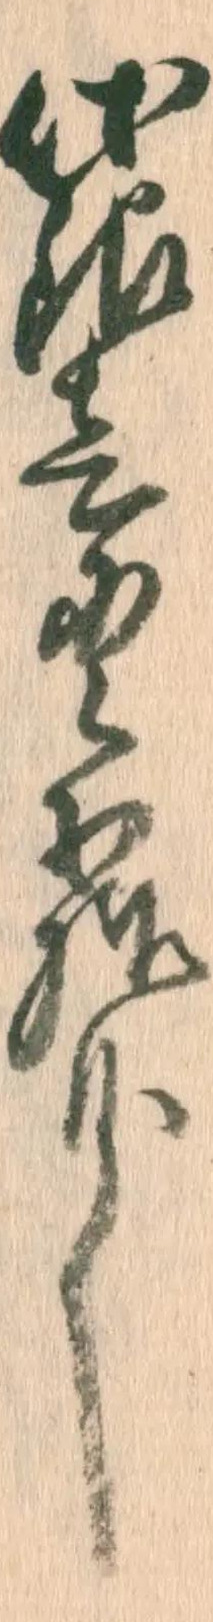代銀壱貫五拾匁
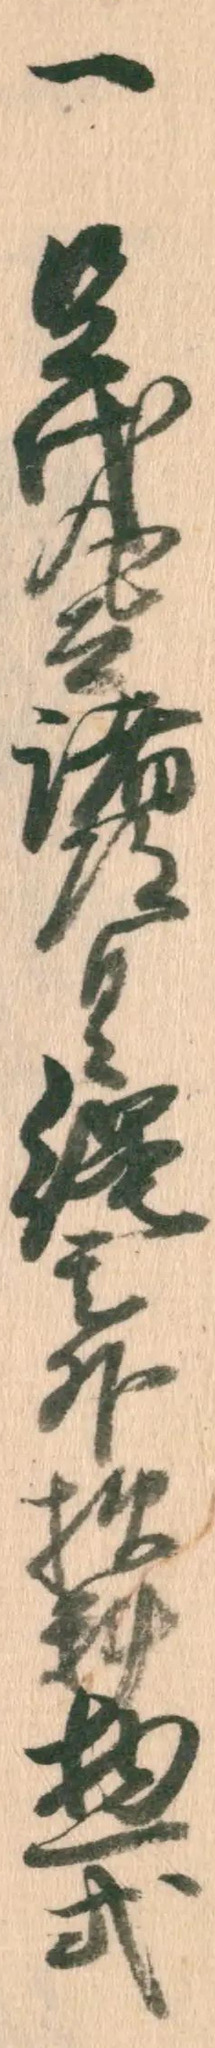一足代丸太諸道具縄其外損料物一式
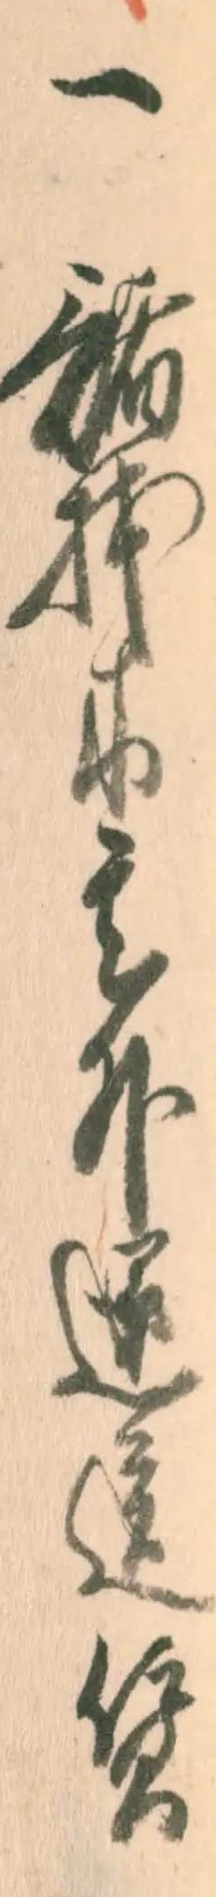一諸材木其外運送賃
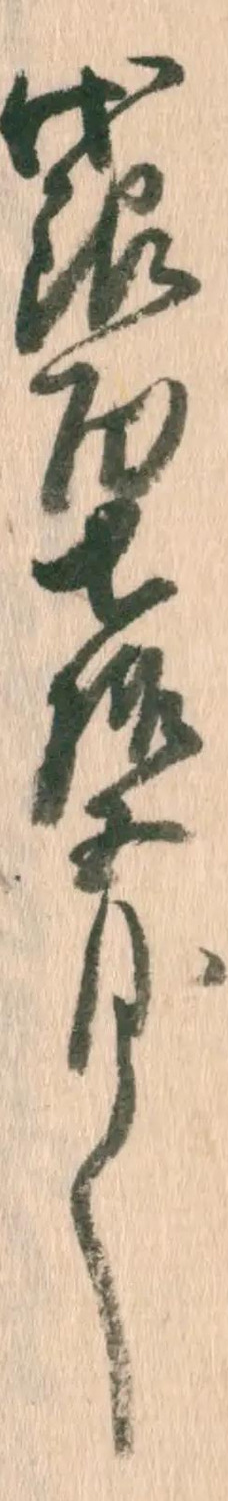代銀百七拾五匁
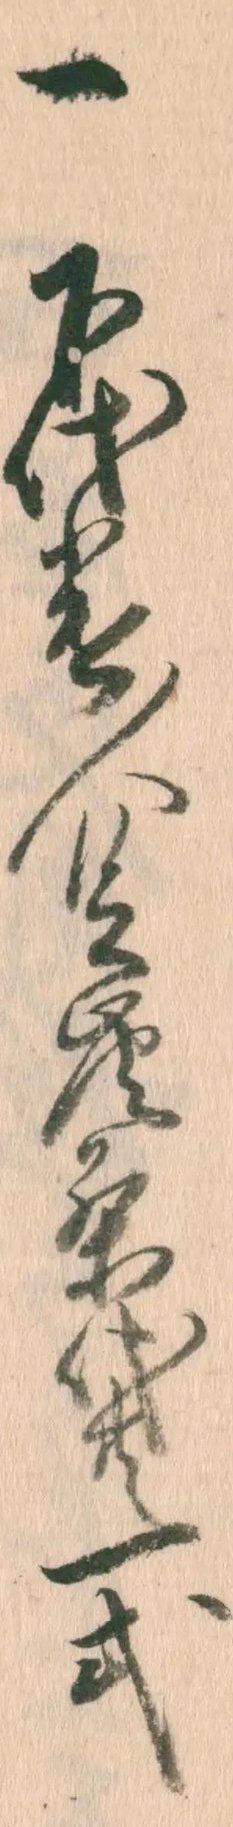一下代遣人足炭茶代共一式
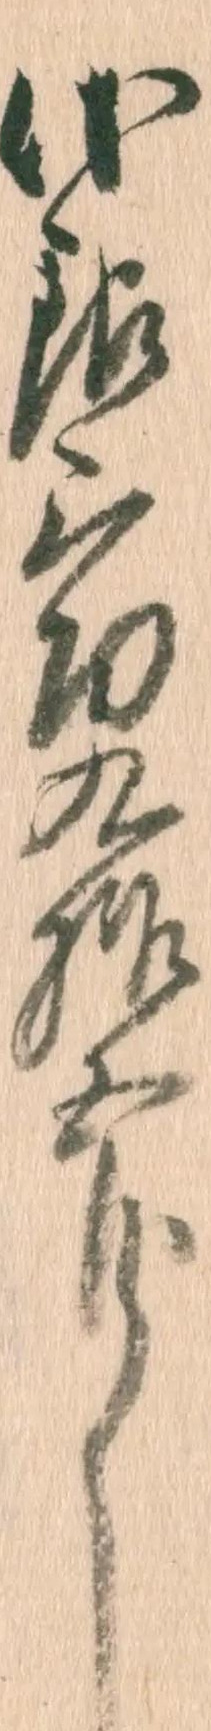代銀三百九拾五匁
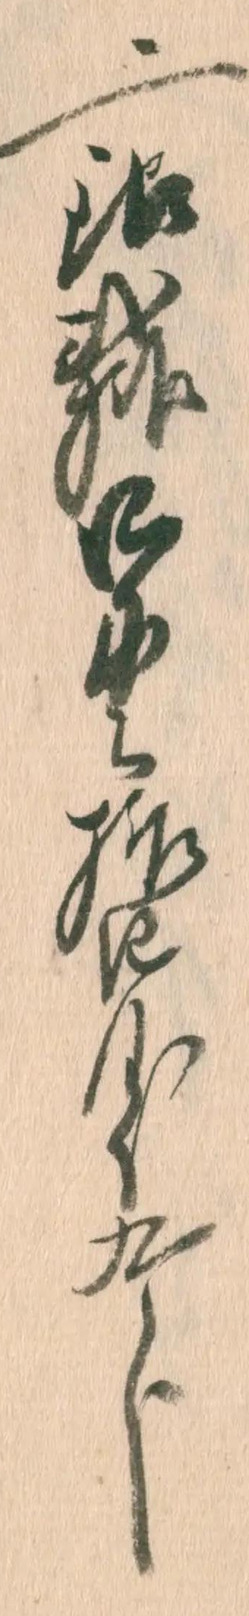〆銀弐拾四貫拾四匁九分

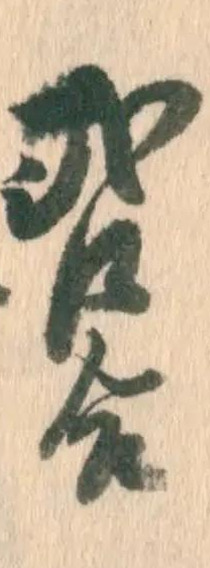弐口合
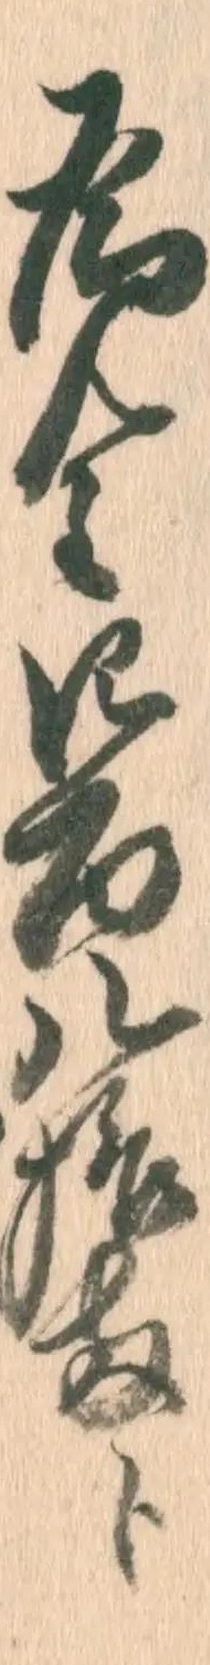為金四百八拾両ト
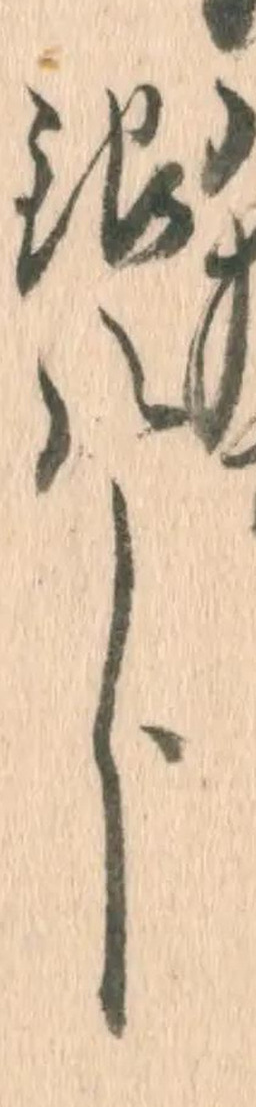銀八分
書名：三十三間堂. [1]
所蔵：国立国会図書館 National Diet Library, JAPAN
